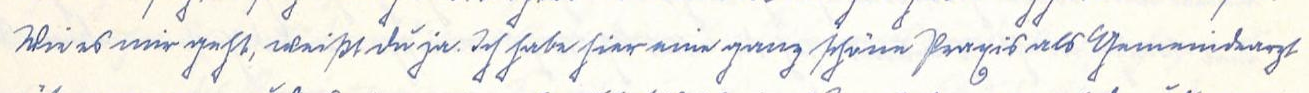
Wie es mir geht, weißt du ja. Ich habe hier eine ganz schöne Praxis als Gemeindearzt
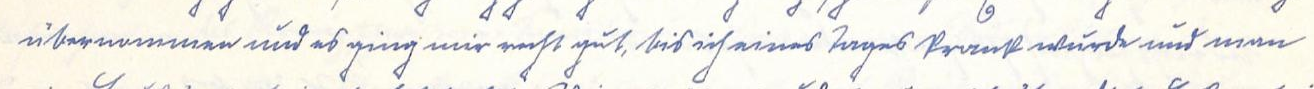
übernommen und es ging mir recht gut, bis ich eines Tages krank wurde und man
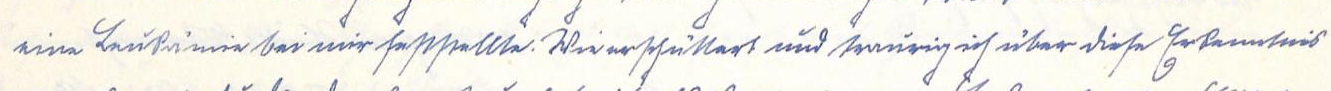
eine Leukämie bei mir feststellte. Wie erschüttert und traurig ich über diese Erkenntnis
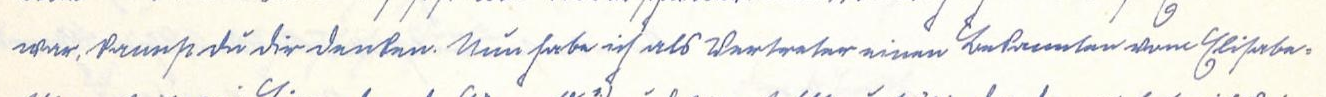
war, kannst du dir denken. Nun habe ich als Vertreter einen Bekannten vom Elisabe-
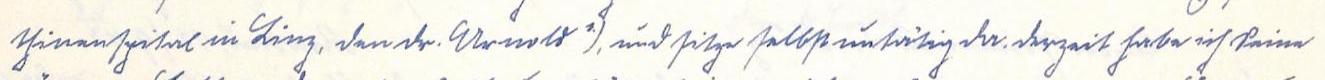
thinenspital in Linz, den Dr. Arnold 1) und sitze selbst untätig da. Derzeit habe ich keine
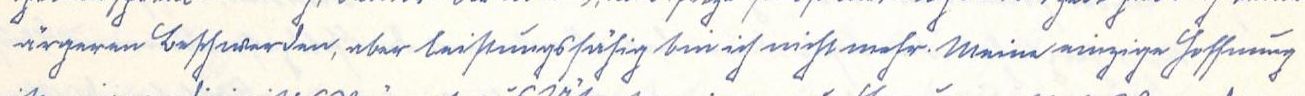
ärgeren Beschwerden, aber leistungsfähig bin ich nicht mehr. Meine einzige Hoffnung
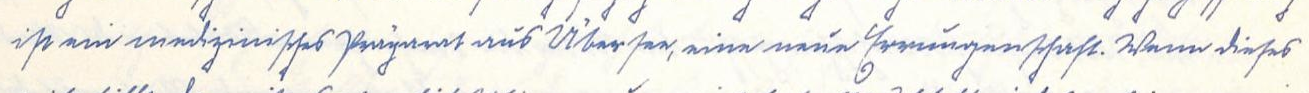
ist ein medizinisches Präparat aus Übersee, eine neue Errungenschaft. Wenn dieses
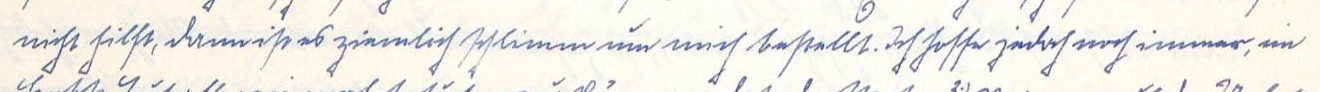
nicht hilft, dann ist es ziemlich schlimm um ich bestellt. Ich hoffe jedoch noch immer, im
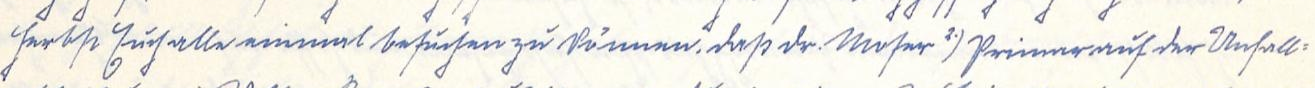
Herbst Euch alle einmal besuchen zu können“. Daß Dr. Moser 2) Primar auf der Unfall-
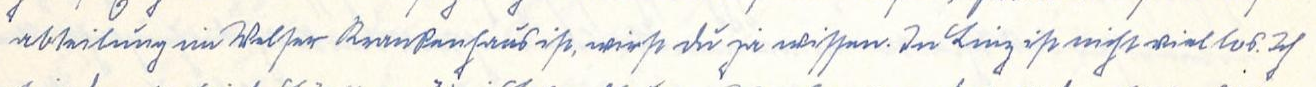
abteilung im Welser Krankenhaus ist, wirst du ja wissen. In Linz ist nicht viel los. Ich
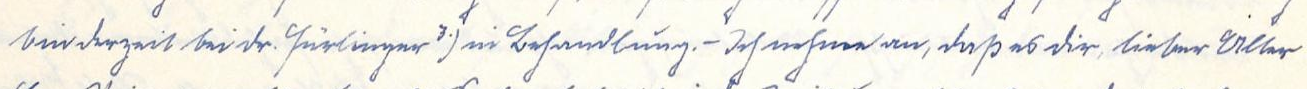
bin derzeit bei Dr. Fürlinger 3) in Behandlung.- Ich nehme an, daß es dir, lieber Alter
